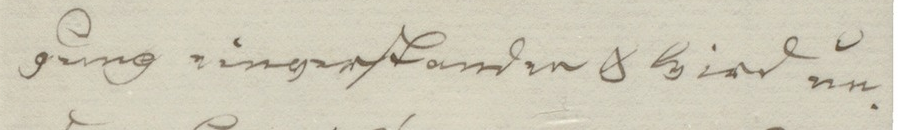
gung einverstanden & wird un-
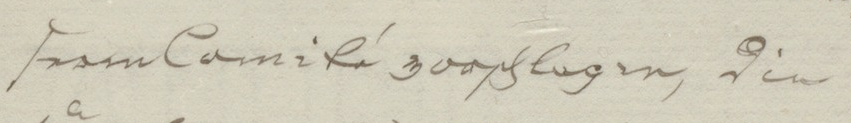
serm Comité vorschlagen, die
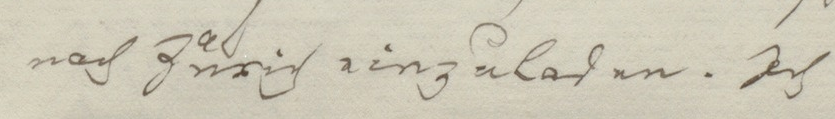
nach Zürich einzuladen. Ich
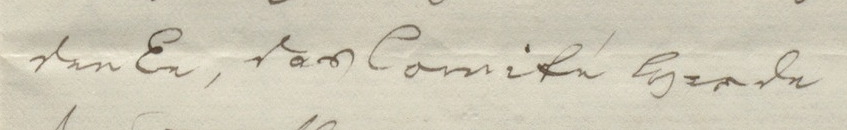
denke, das Comité werde
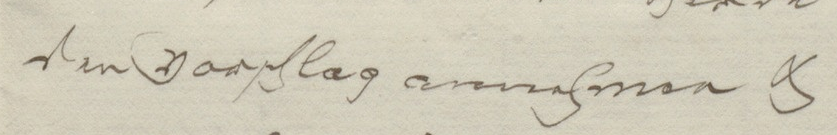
den Vorschlag annehmen &
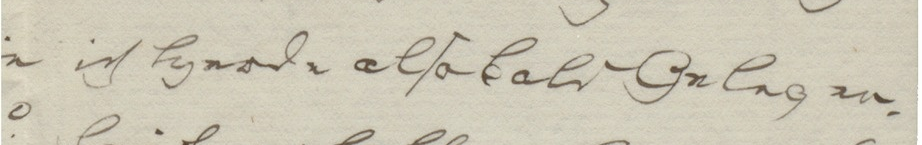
ich werde also bald Gelegen-
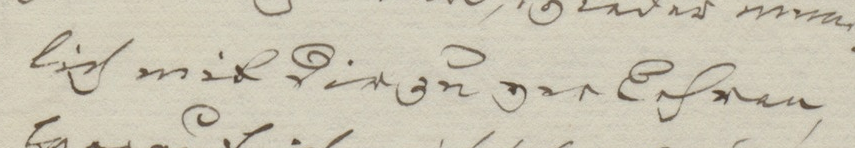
lich mit Dir zu verkehren,
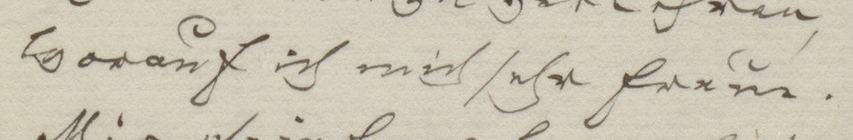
worauf ich mich sehr freue.
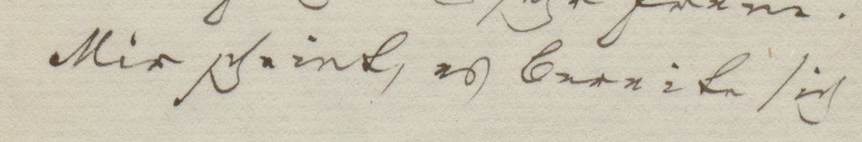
Mir scheint, es bereite sich
